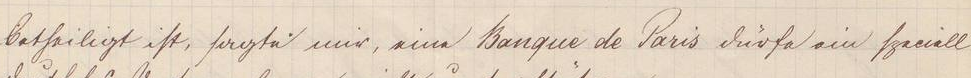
betheiligt ist, sagte mir, eine Banque de Paris dürfe ein speciell
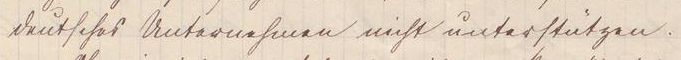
deutsches Unternehmen nicht unterstützen.
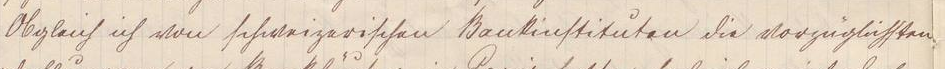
Obgleich ich von schweizerischen Bankinstituten die vorzüglichsten
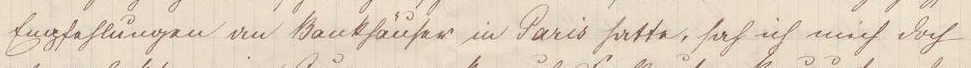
Empfehlungen an Bankhäuser in Paris hatte, sah ich mich doch
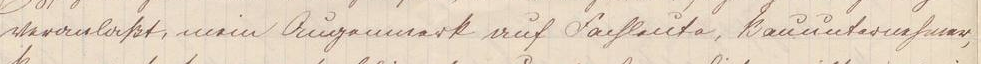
veranlaßt, mein Augenmerk auf Fachleute, Bauunternehmen,
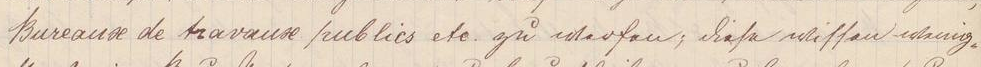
Bureaux de travaux publics etc. zu werfen; diese wissen wenig-
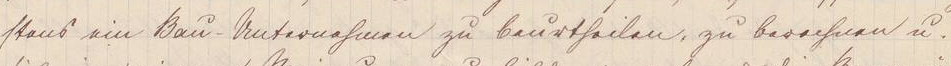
stens ein Bau-Unternehmen zu beurtheilen, zu berechnen u.
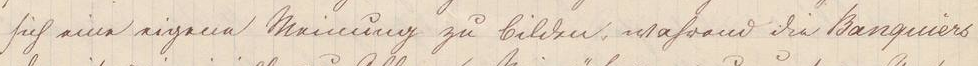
sich eine eigene Meinung zu bilden, wahrend die Banquiers
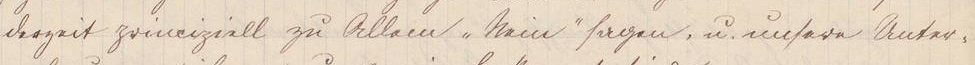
derzeit principiell zu Allem «Nein» sagen, u. unsere Unter-
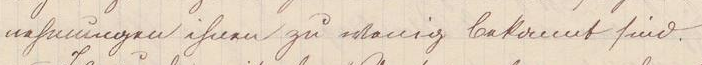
nehmungen ihnen zu wenig bekannt sind.
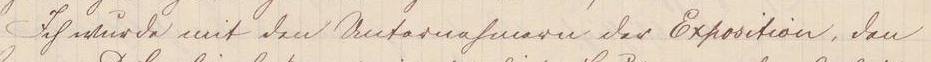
Ich wurde mit den Unternehmern der Exposition, den
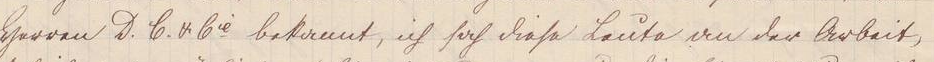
Herren D. C. & Cie bekannt, ich sah diese Leute an der Arbeit,
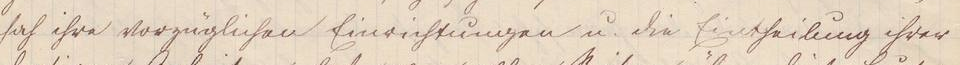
sah ihre vorzüglichen Einrichtungen u. die Eintheilung ihrer
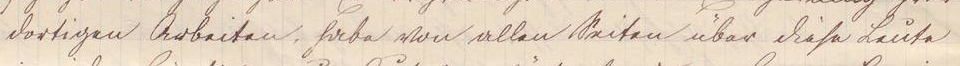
dortigen Arbeiten, habe von allen Seiten über diese Leute
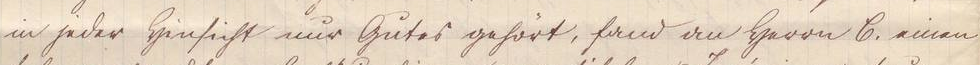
in jeder Hinsicht nur Gutes gehört, fand an Herrn C. einen
